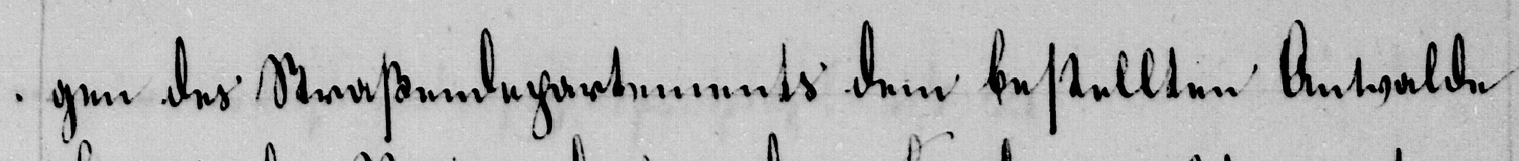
gen des Straßendepartements dem bestellten Anwalde
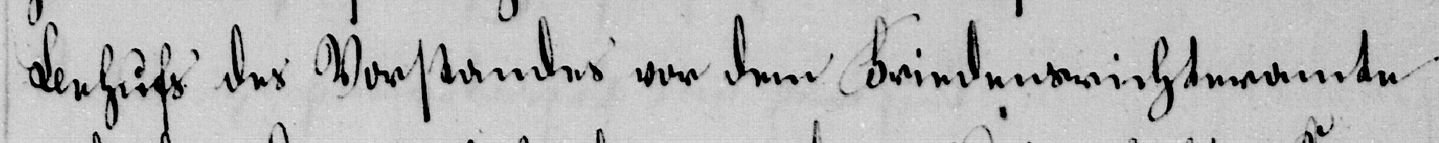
Behufs des Vorstandes vor dem Friedensrichteramte
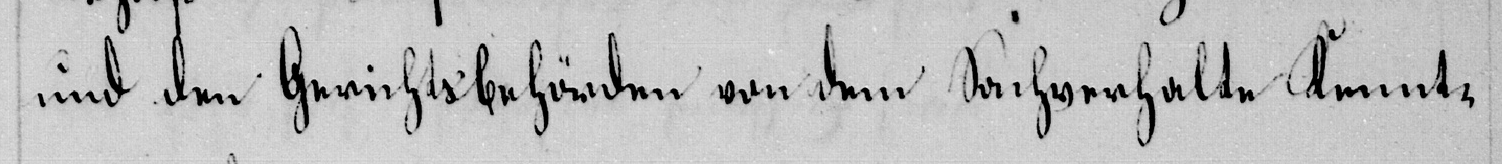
und den Gerichtsbehörden von dem Sachverhalte Kennt¬
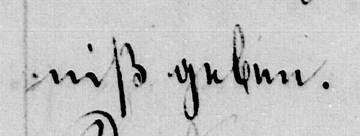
niß geben.
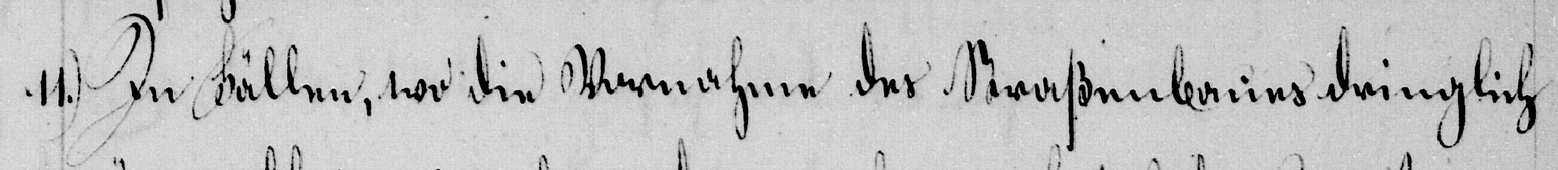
11.) In Fällen, wo die Vornahme des Straßenbaues dringlich
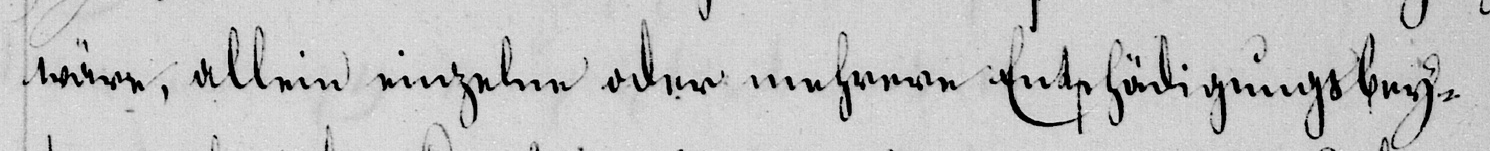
wäre, allein einzelne oder mehrere Entschädigungsbey¬
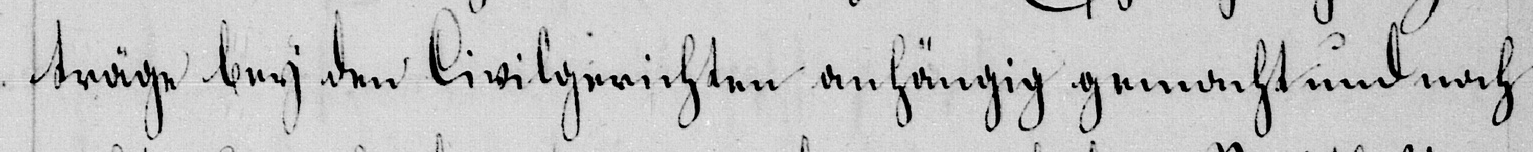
träge bey den Civilgerichten anhängig gemacht und noch
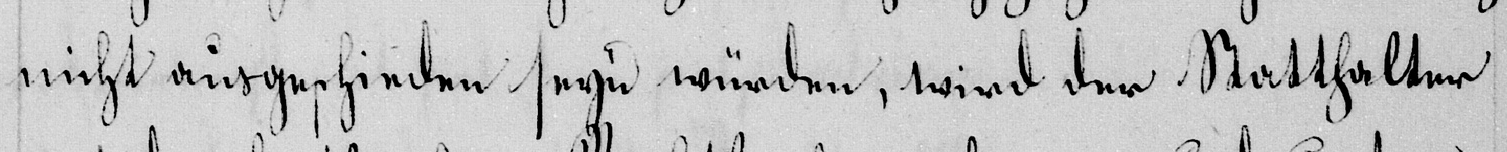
nicht ausgeschieden seyn würden, wird der Statthalter
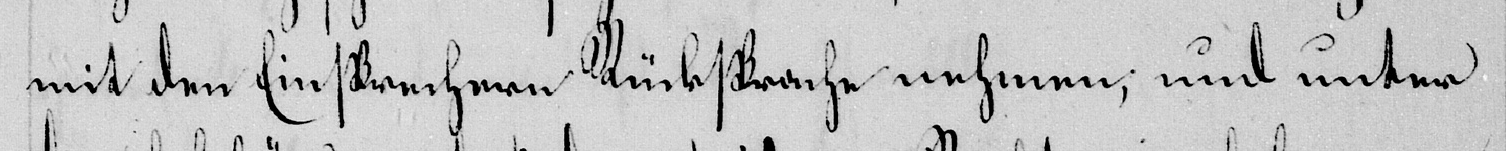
mit den Einsprechern Rücksprache nehmen, und unter
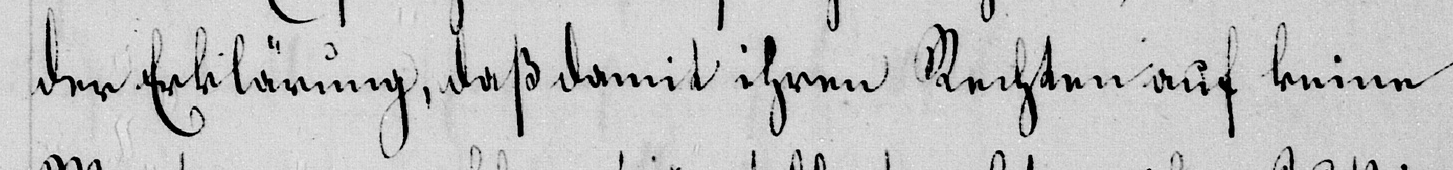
der Erklärung, daß damit ihren Rechten auf keine
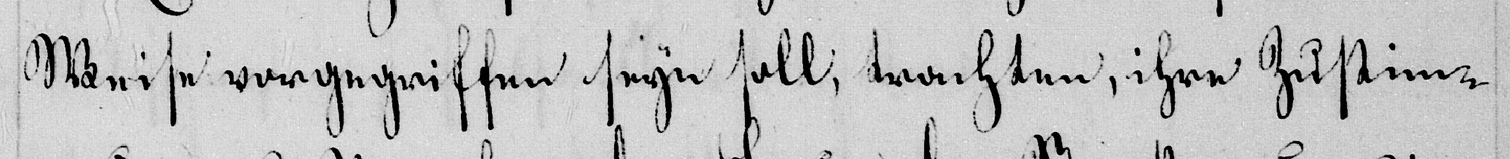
Weise vorgegriffen seyn soll, trachten, ihre Zustim¬
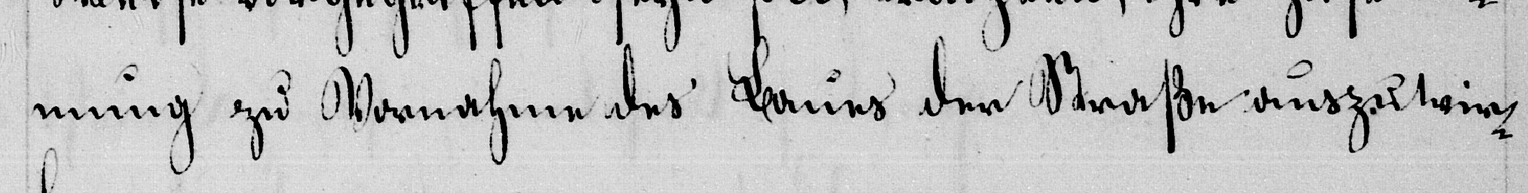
mung zu Vornahme des Baues der Straße auszuwir¬
